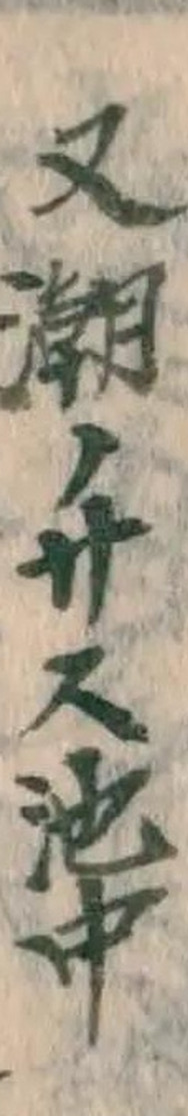又潮ノサス池中
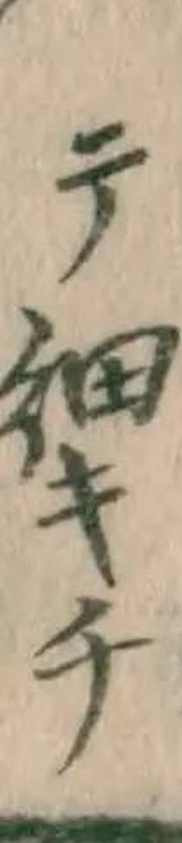テ細キチ
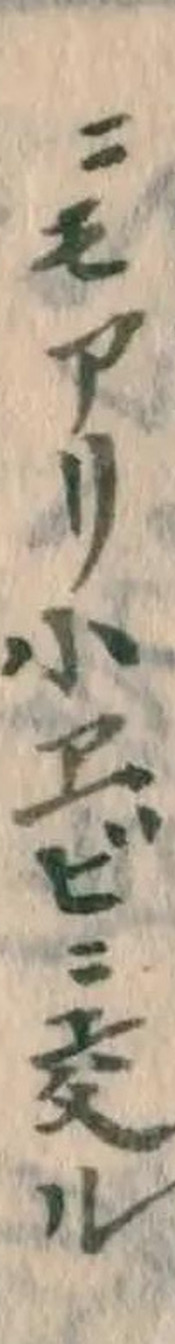ニモアリ小ヱビニ交ル
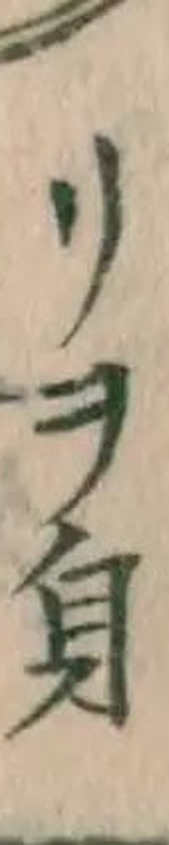リヲ身
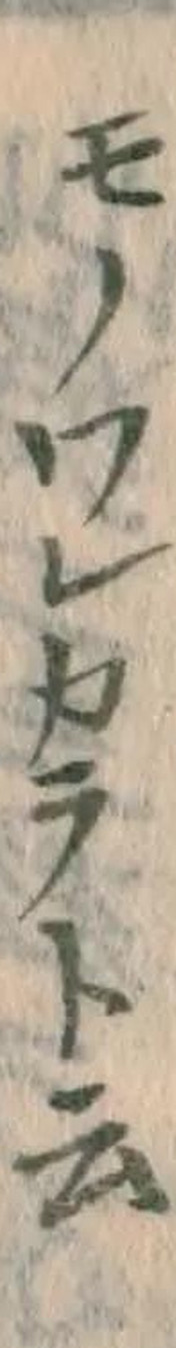モノワレカラト云
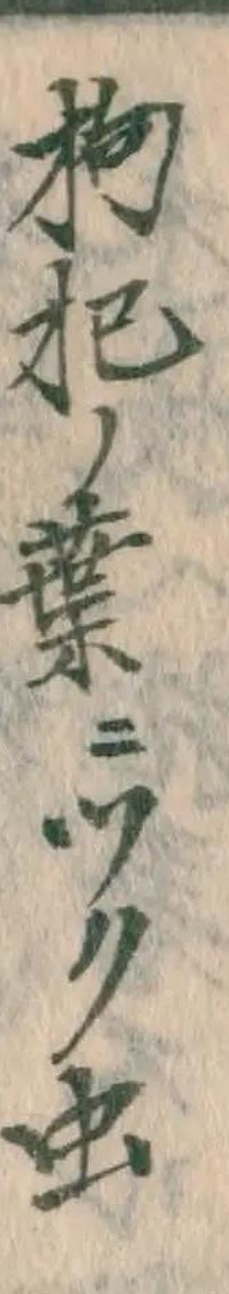枸杞ノ葉ニツク虫
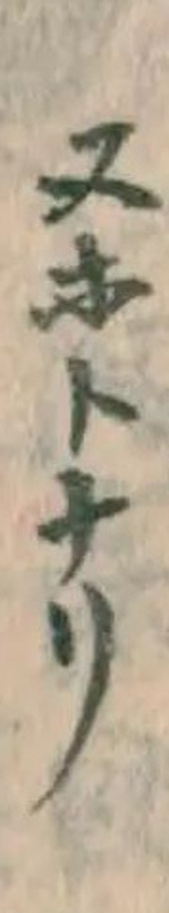ヌホトナリ
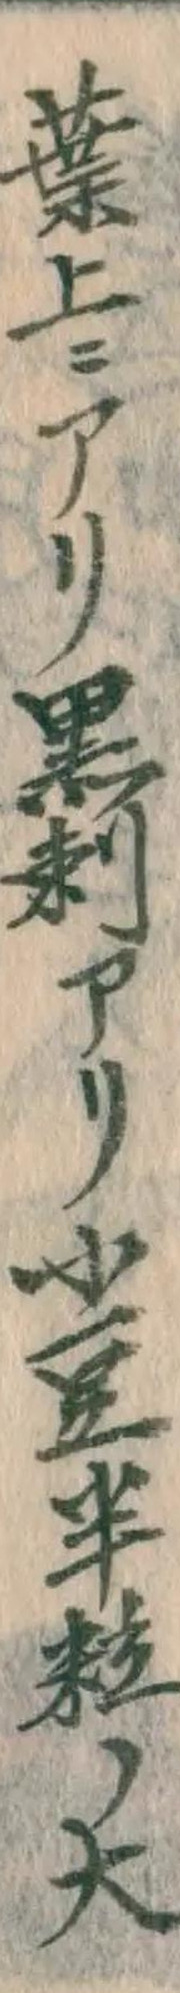葉上ニアリ黒刺アリ小豆半粒ノ大
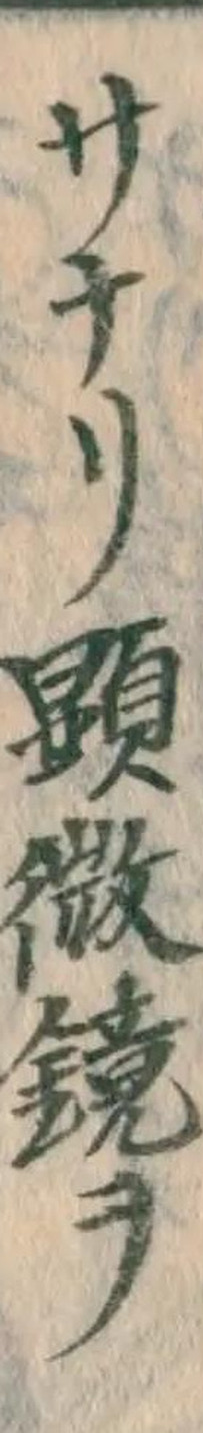サナリ顕微鏡ヲ
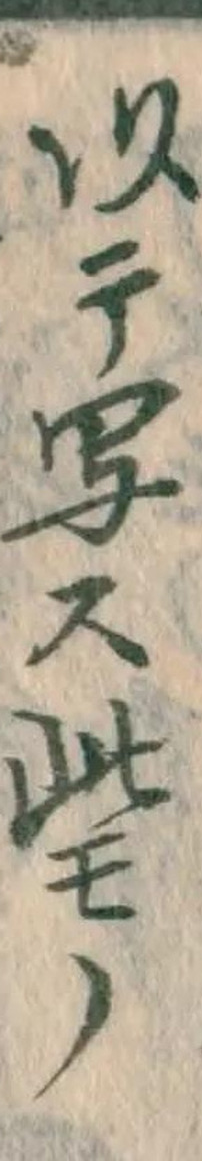以テ写ス此モノ
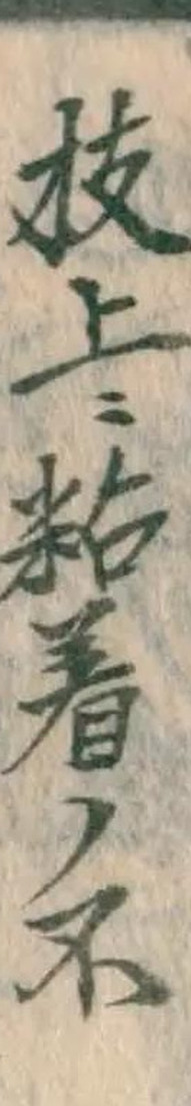枝上ニ粘着ノ不
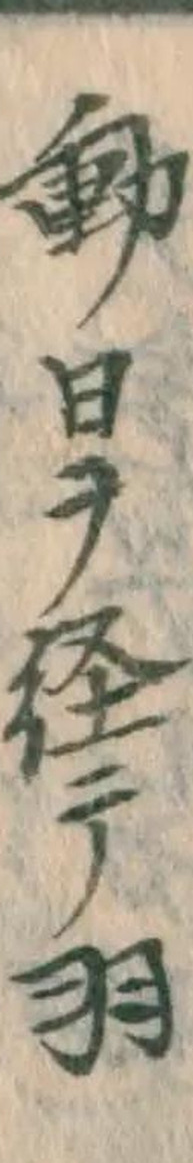動日ヲ経テ羽
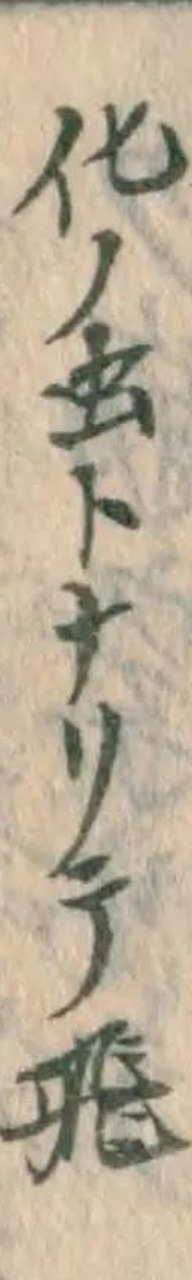化ノ虫トナリテ飛

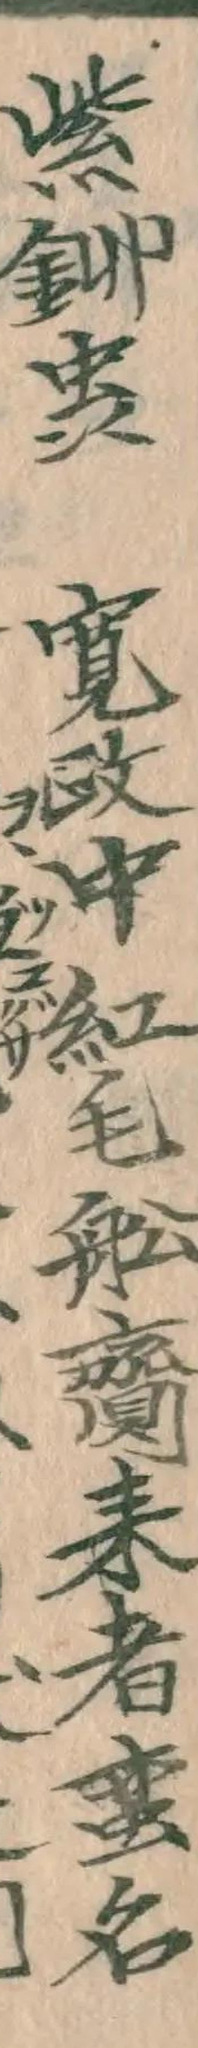紫鉚虫寛政中紅毛舩齎来者蛮名
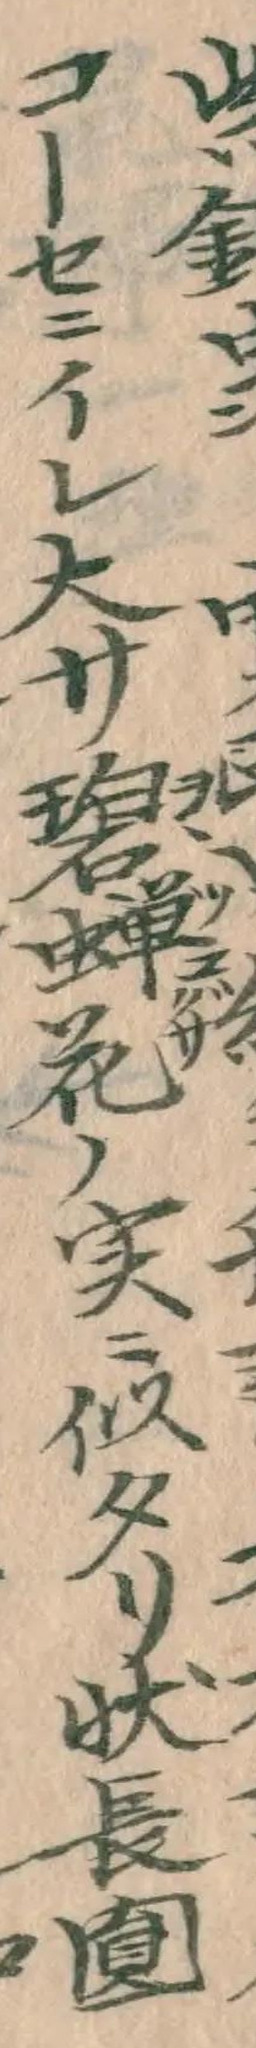コーセニイレ大サ碧蝉花ノ実ニ似タリ状長円
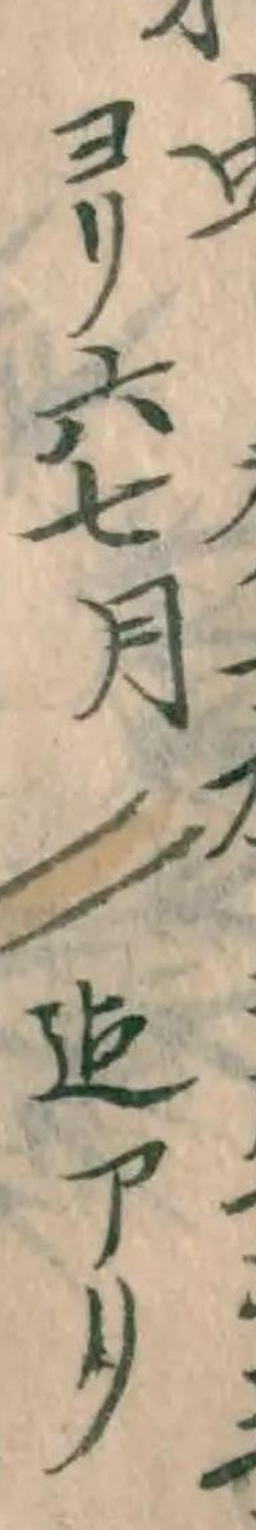ヨリ六七月迄アリ
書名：千蟲譜 3巻. [3]
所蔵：国立国会図書館 National Diet Library, JAPAN
